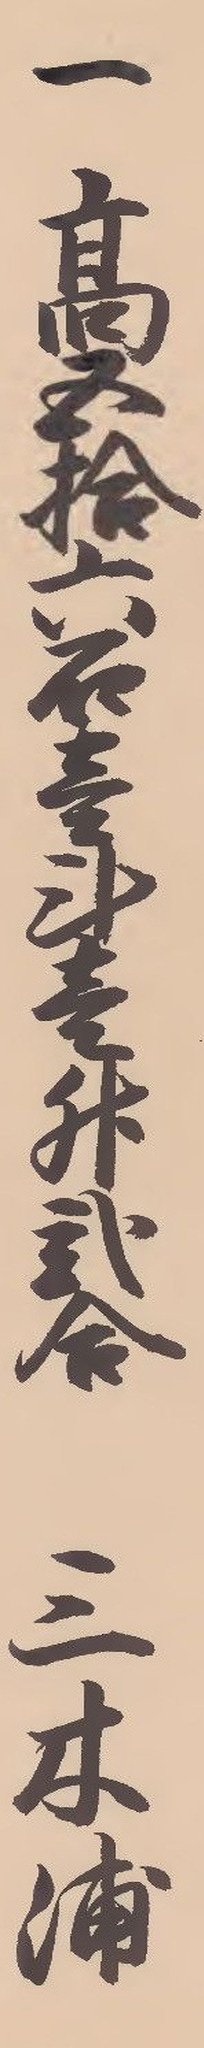一高五拾六石壱斗壱升弐合三木浦
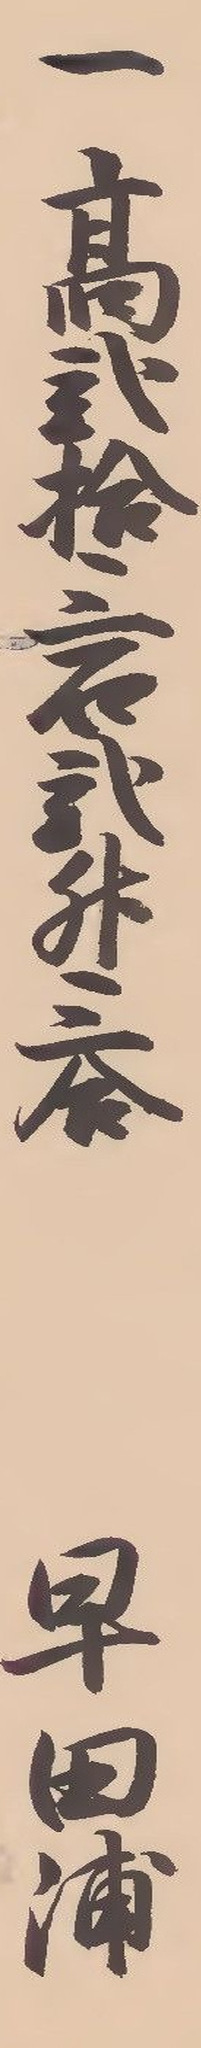一高弐拾三石弐升三合早田浦
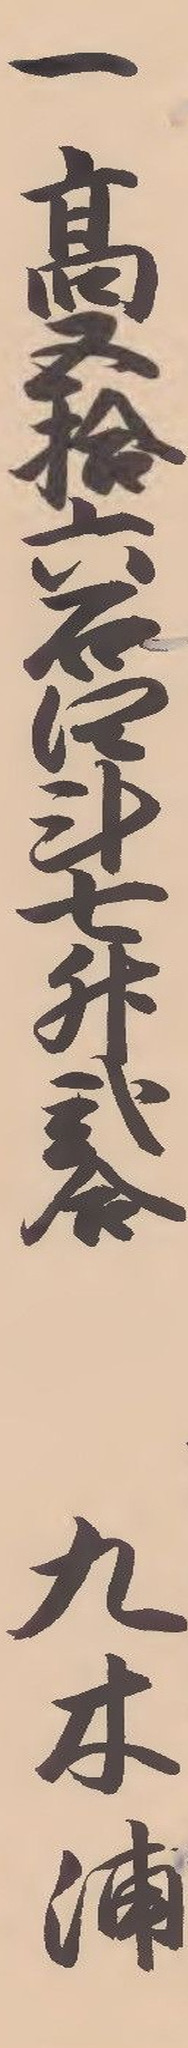一高五拾六石壱斗壱升弐合三木浦
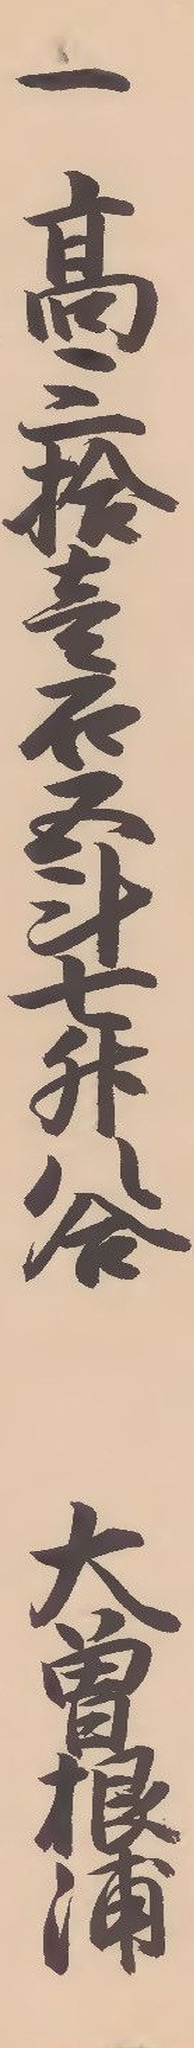一高三拾壱石五斗七升八合大曽根浦
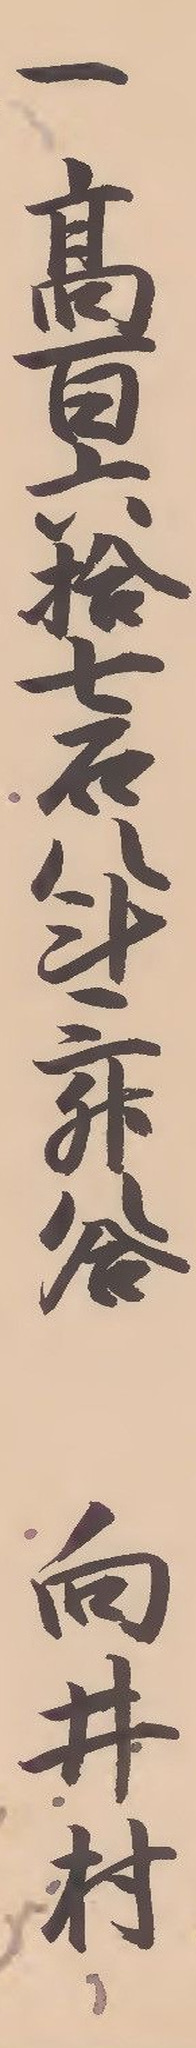一高百六拾七石八斗三升八合向井村

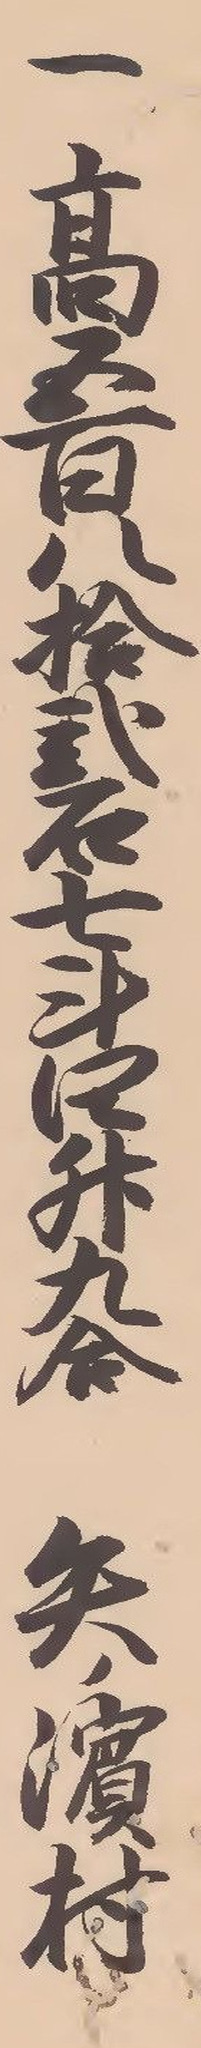一高五百八拾弐石七斗四升九合矢ノ浜村
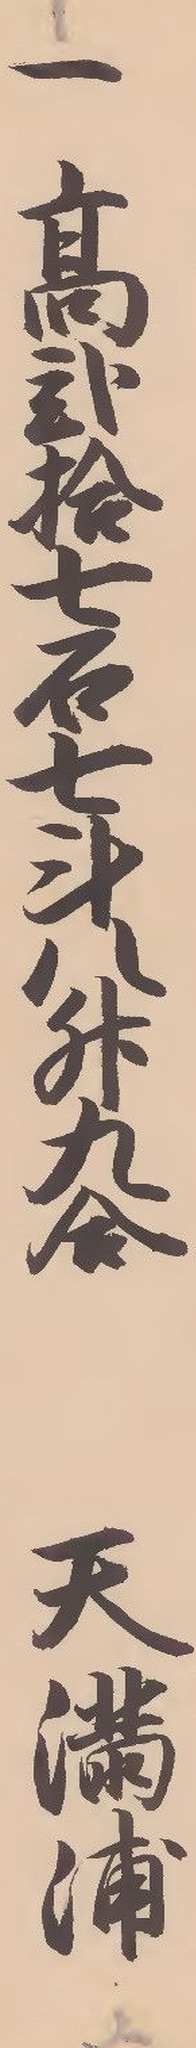一高弐拾七石七斗八升九合天満浦
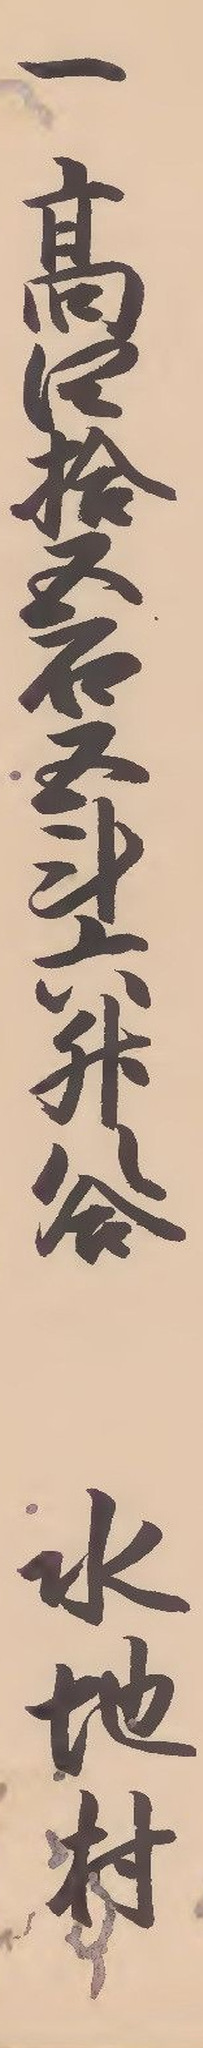一高四拾五石五斗六升八合水地村

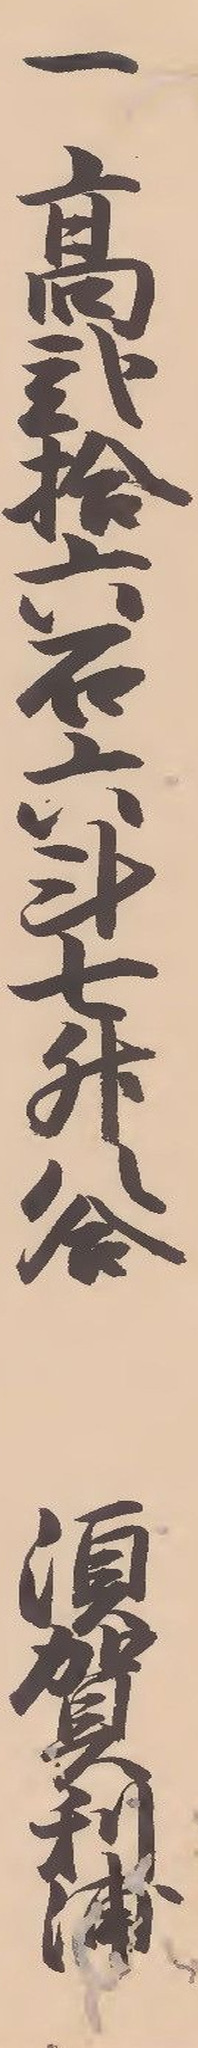一高弐拾六石六斗七升八合須質利浦
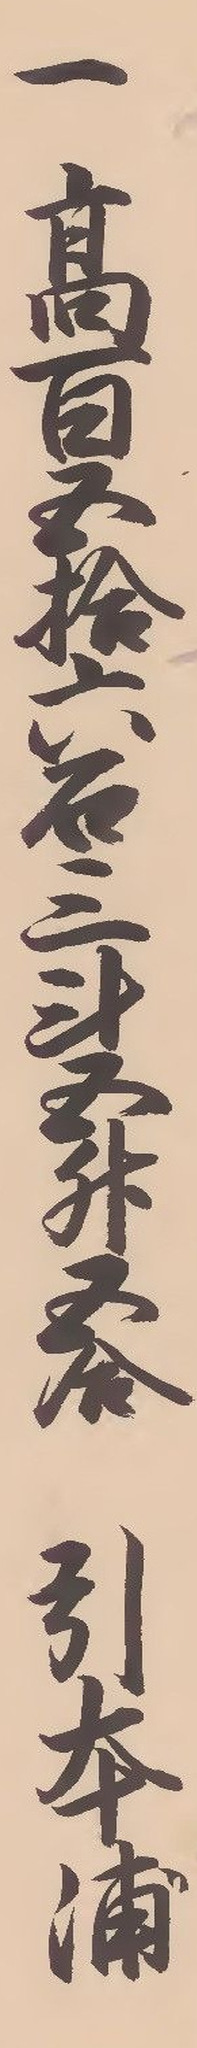一高百五拾六石三斗五升五合引本浦
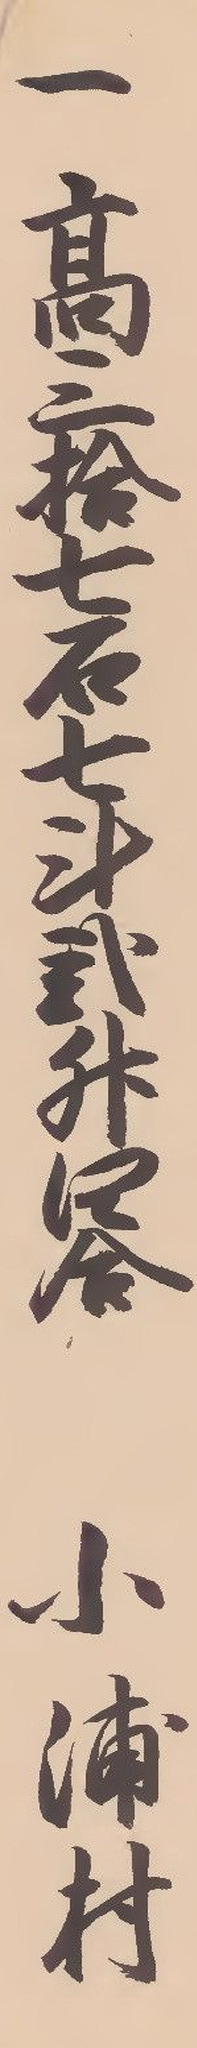一高三拾七石七斗弐升四合小浦村
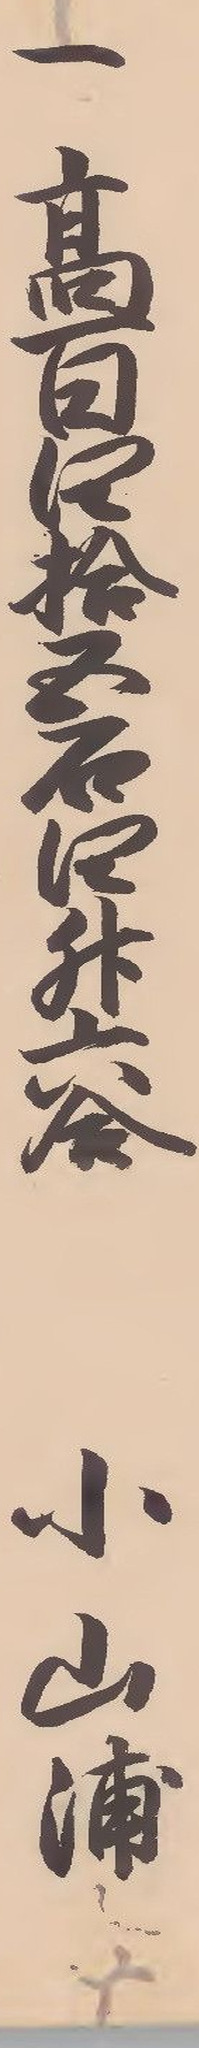一高百四拾五石四升六合小山浦

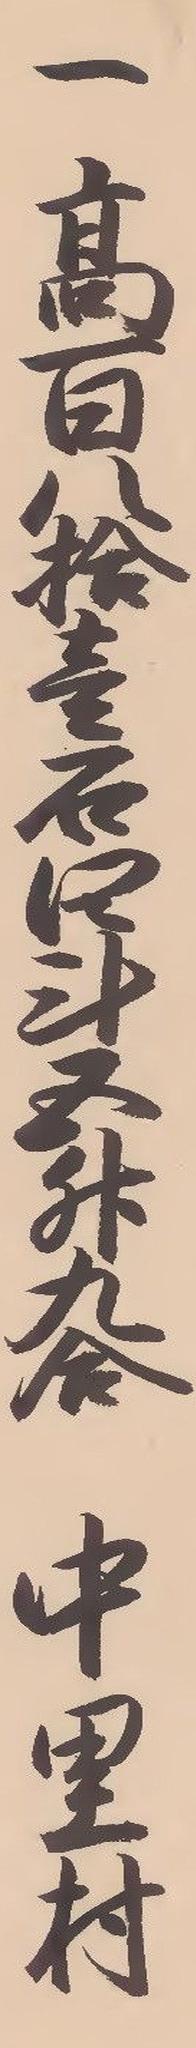一高百八拾壱石四斗五升九合中里村
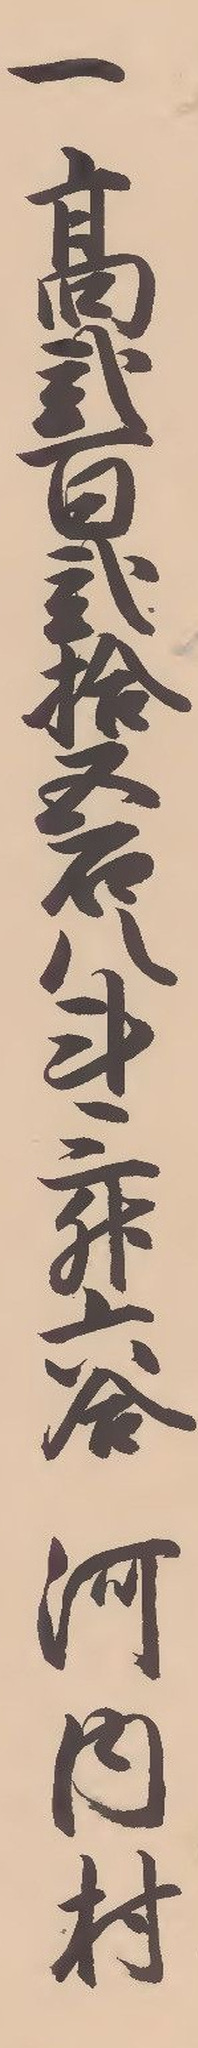一高弐百弐拾五石八斗三升六合河内村
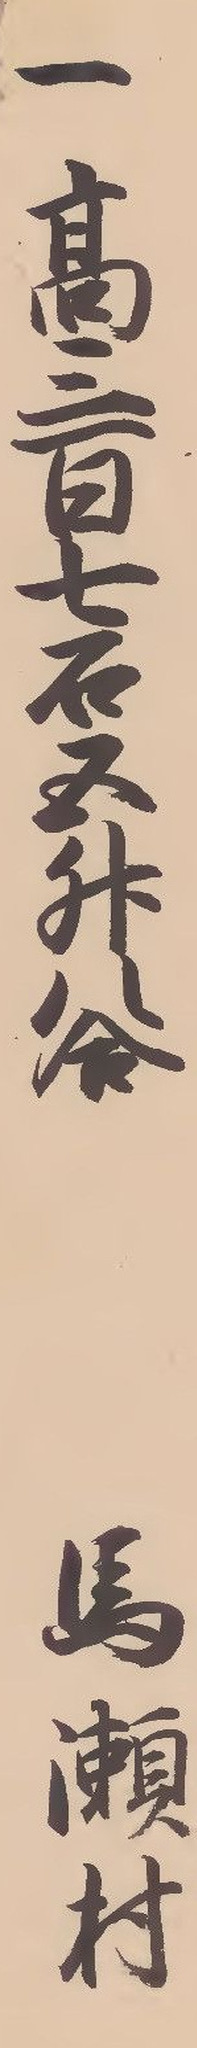一高三百七石五升八合馬瀬村
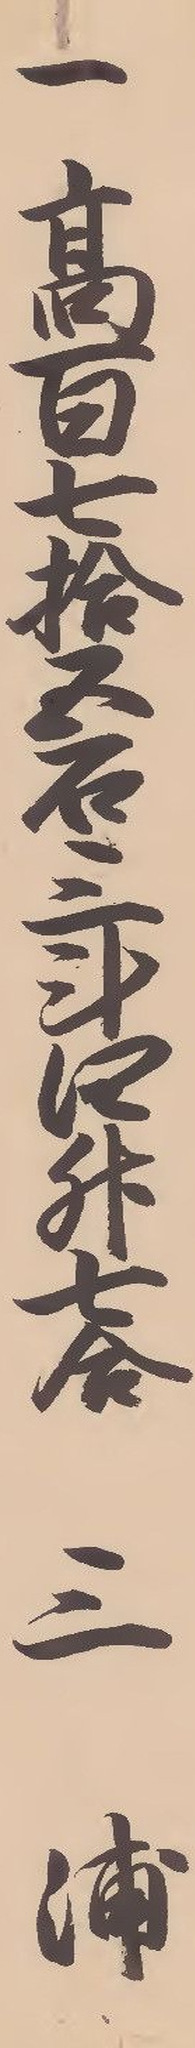一高百七拾五石三斗四升七合三浦
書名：紀伊国郷帳
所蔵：国立公文書館 National Archives of Japan
